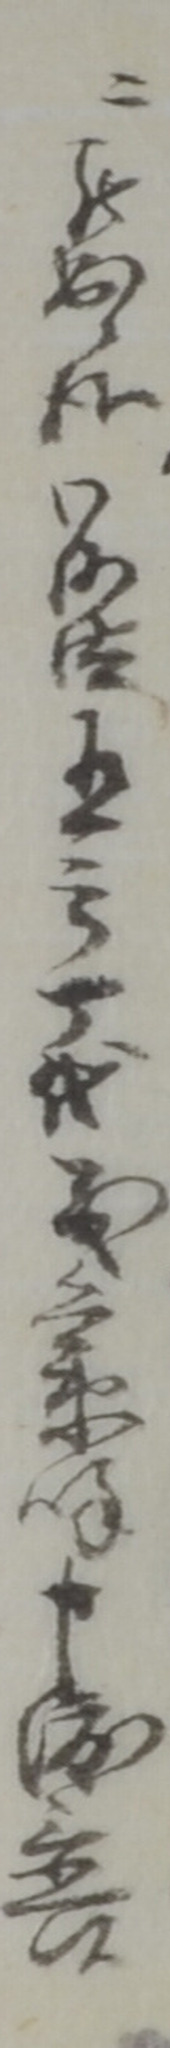ニ罷出候御沙汰有之丁代義兵衛呼申渡置候
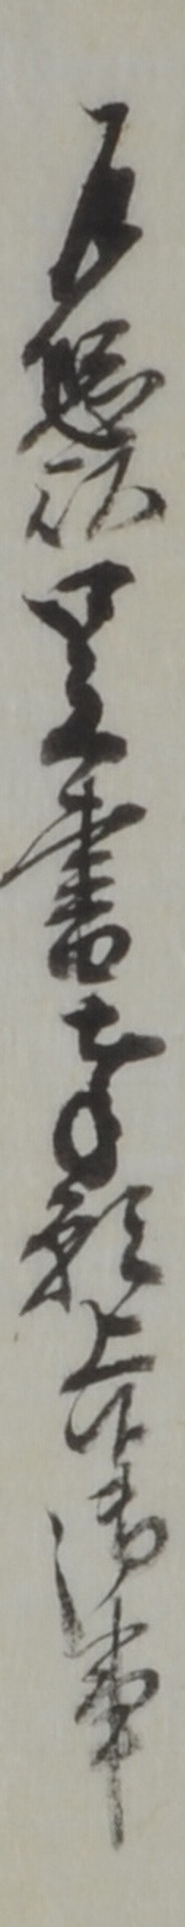乍恐以口上書奉願上候御事
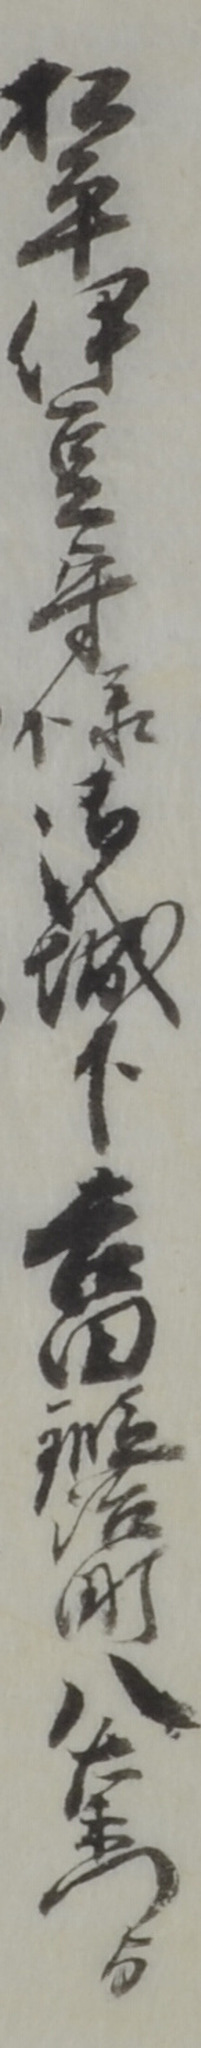松平伊豆守様御城下吉田鍛冶町八右衛門与
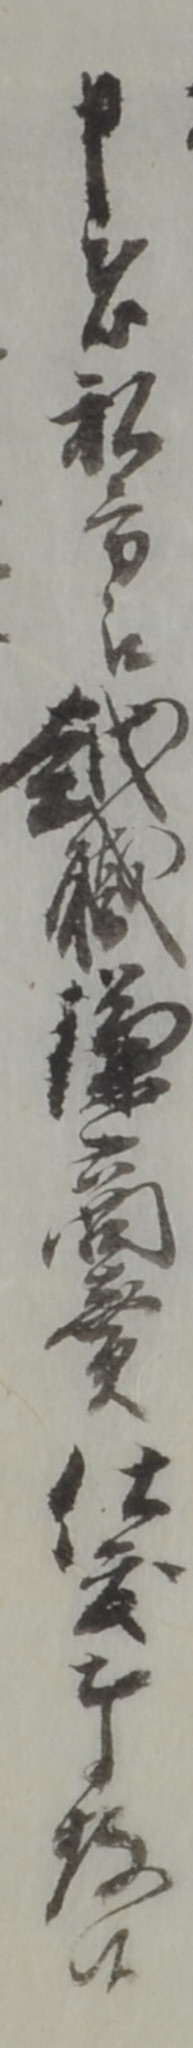申者私方江越職鎌商売仕度奉存候
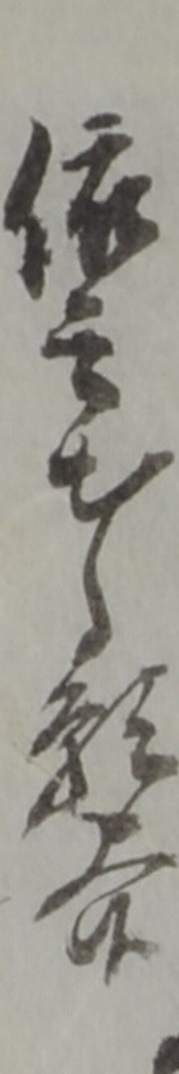依之奉願上候
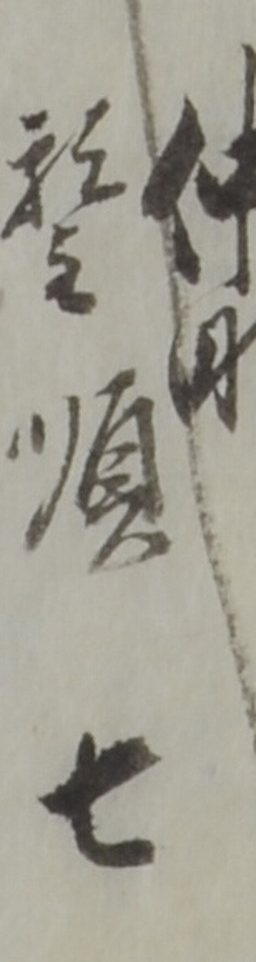願主順七
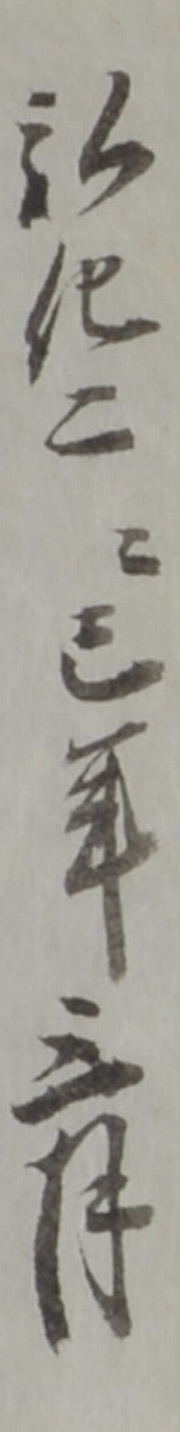弘化二乙巳年三月
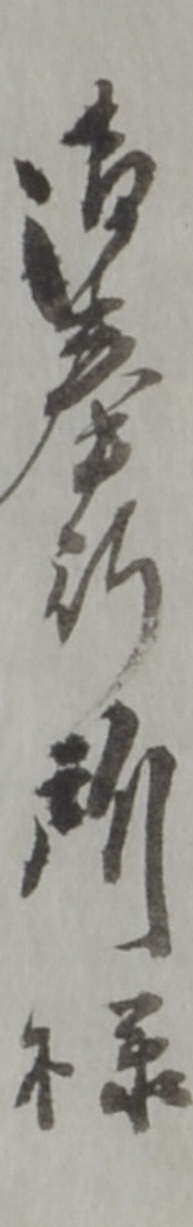御奉行所様
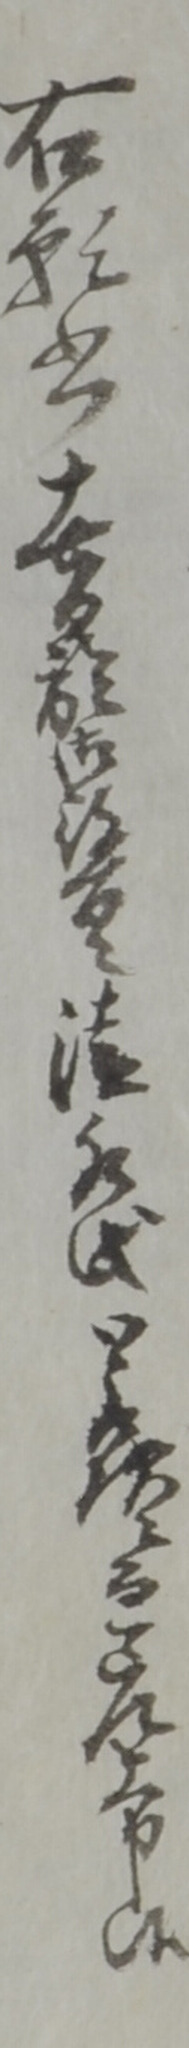右願書十七日於御役所ニ清水氏御取次ニ而差上申候
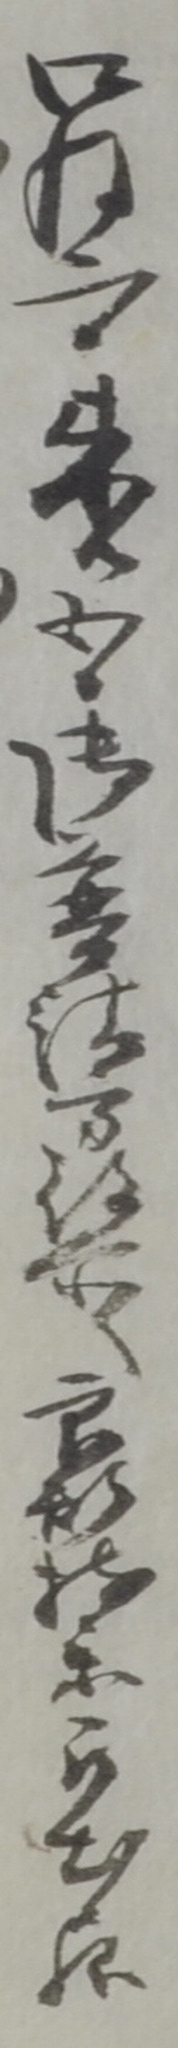四月二日来ル五日御普請方役所へ印形持参罷出候様
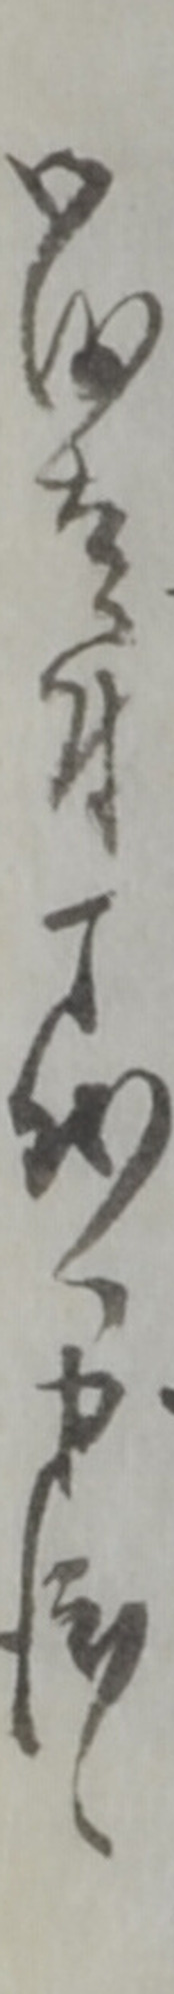御沙太ニ付丁代へ申渡候

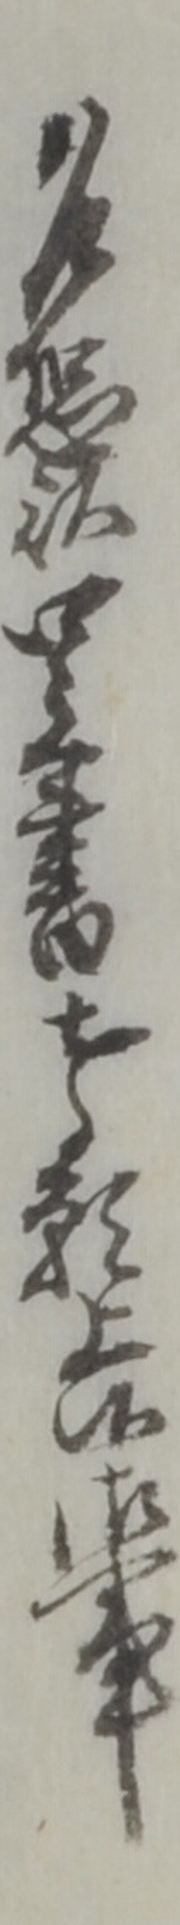乍恐以口上書奉願上候御事
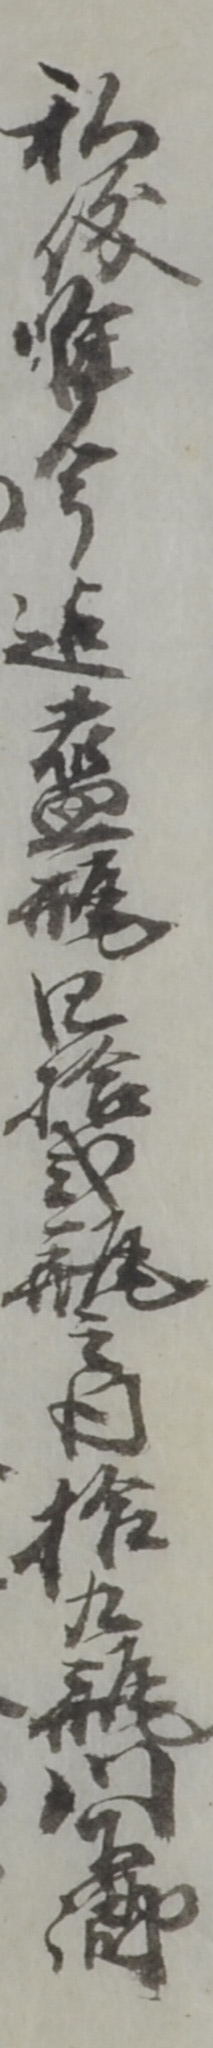私儀唯今迄藍瓶四拾弐瓶内拾九瓶川下郷
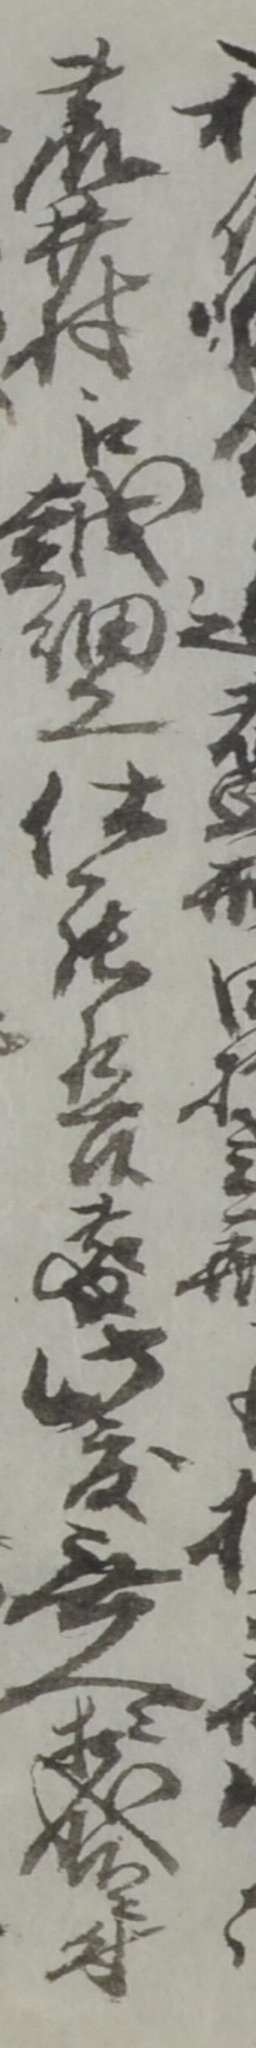荒井村江越細工仕罷在候處此度無人ニ相成ニ付
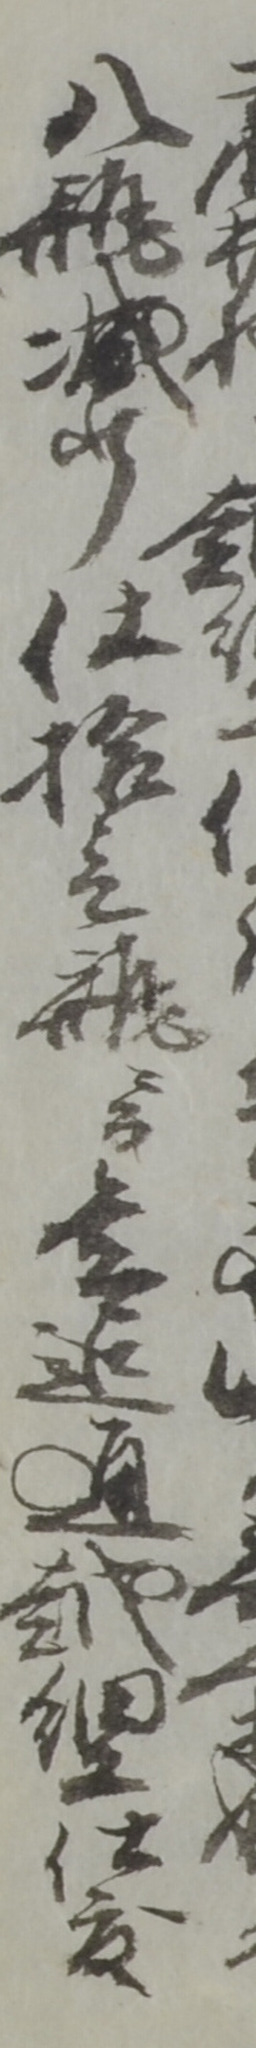八瓶減少仕拾壱瓶ニ而是迄通越細工仕度
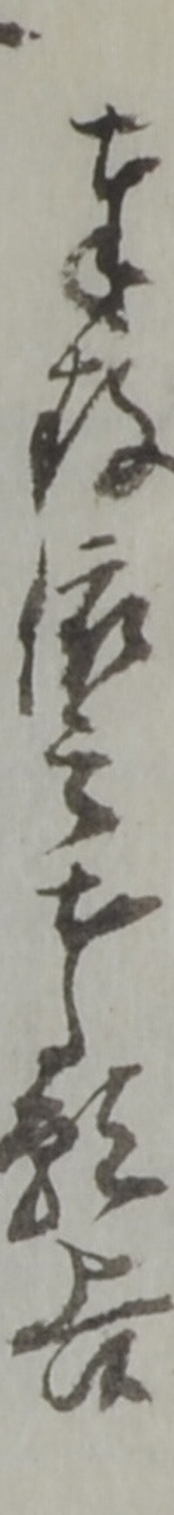奉存依之奉願上候
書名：諸願書控簿
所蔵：伊那市立高遠町図書館・合同会社AMANE
